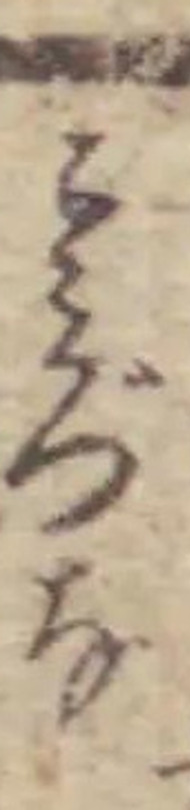こみづな
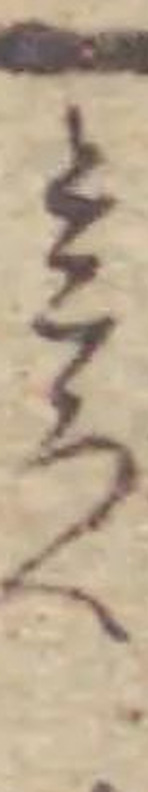ところへ
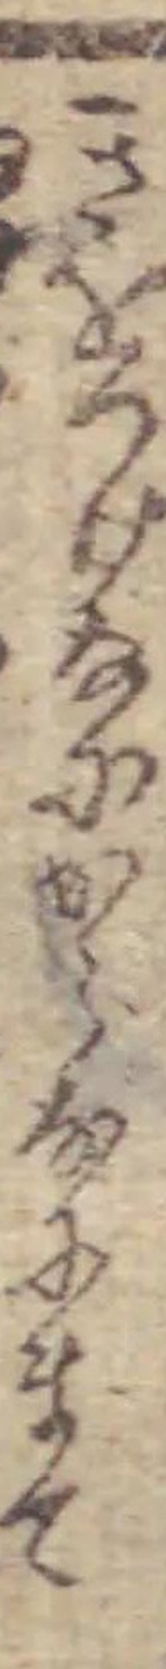きをつけなにからなにまて
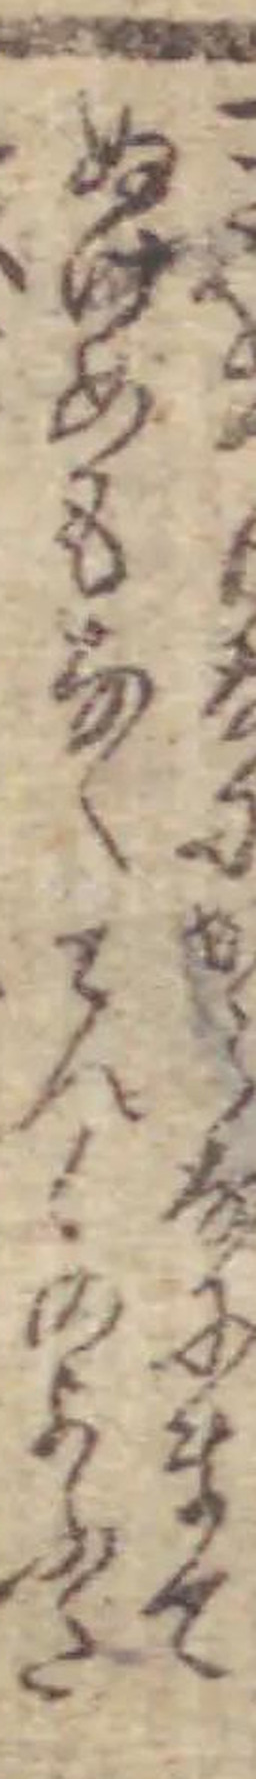ぬけめもなくてんくのよふた
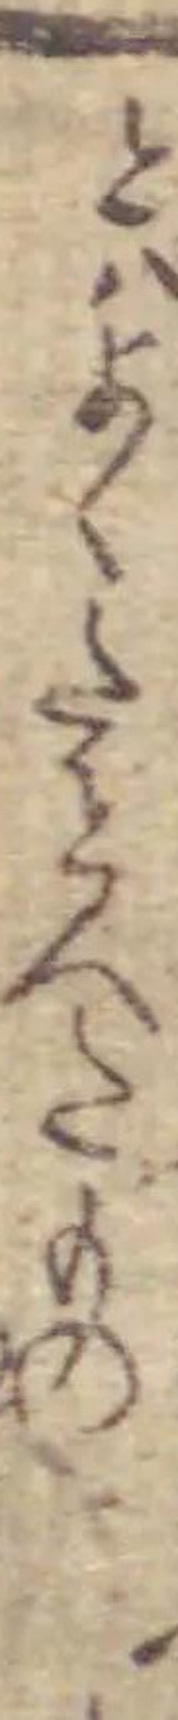とはよくたとへたもの

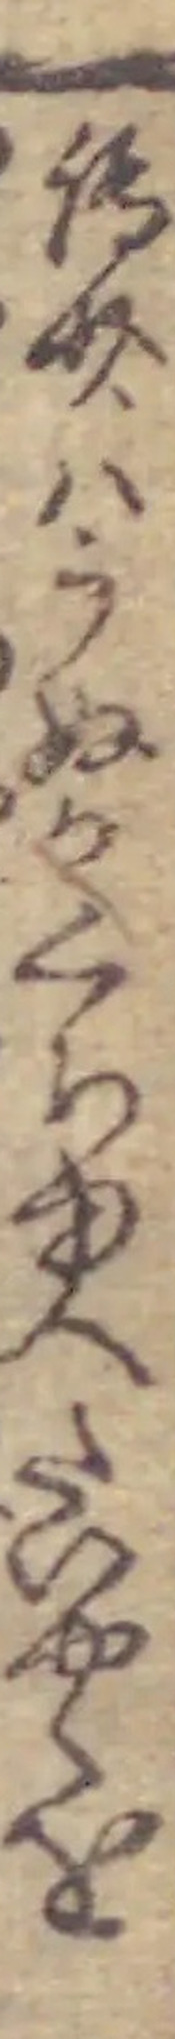伝介はうぬかくちゆへたいやくを
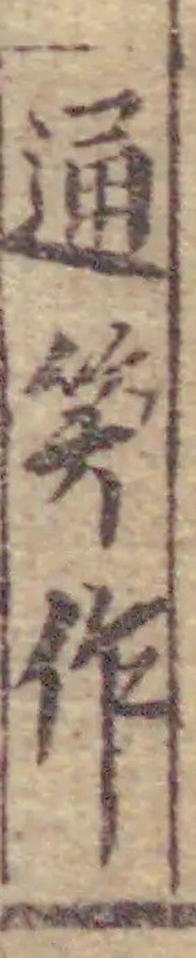通笑作
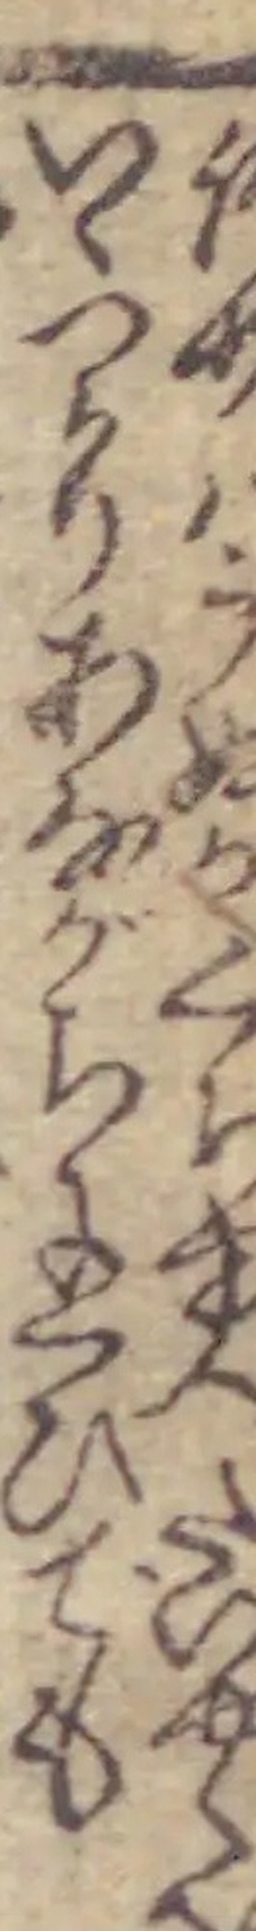いゝつかりあながちにつひでも
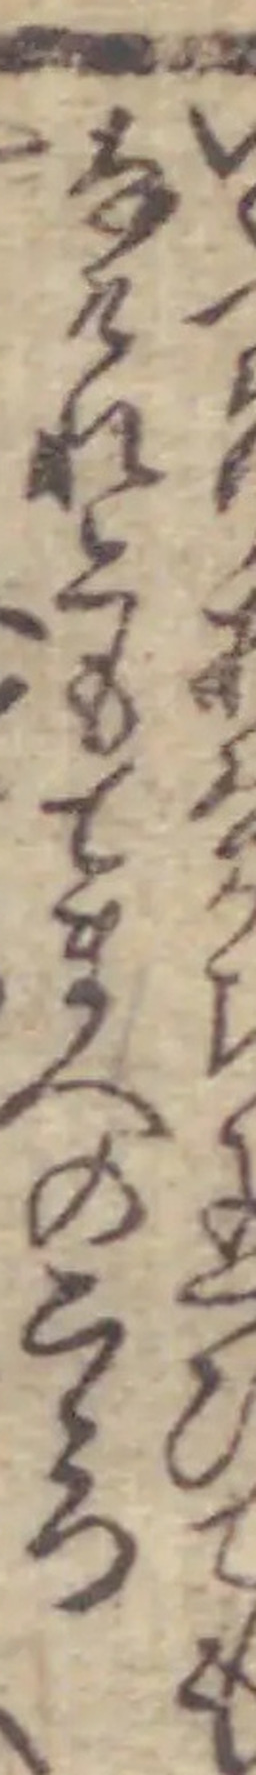なけれともてまへのこゝろ
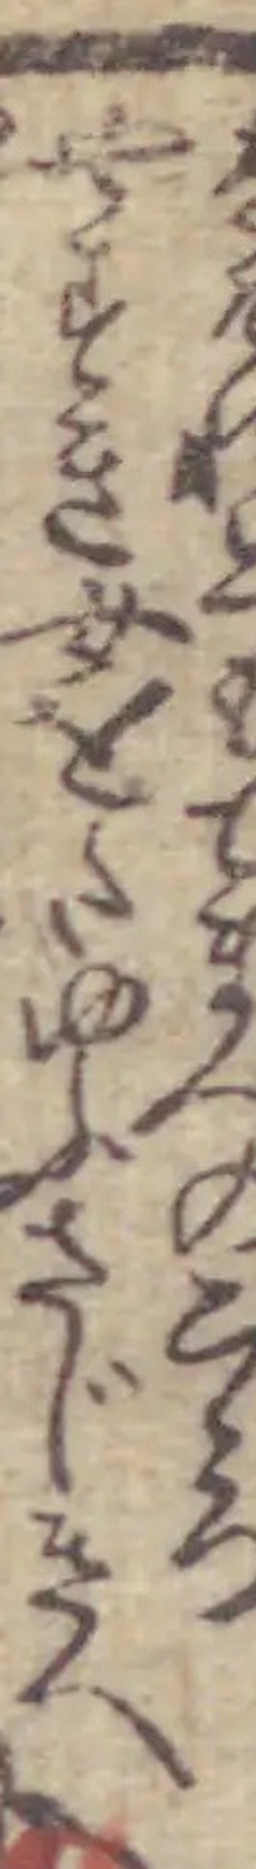やすき女をたゆふさじきへ
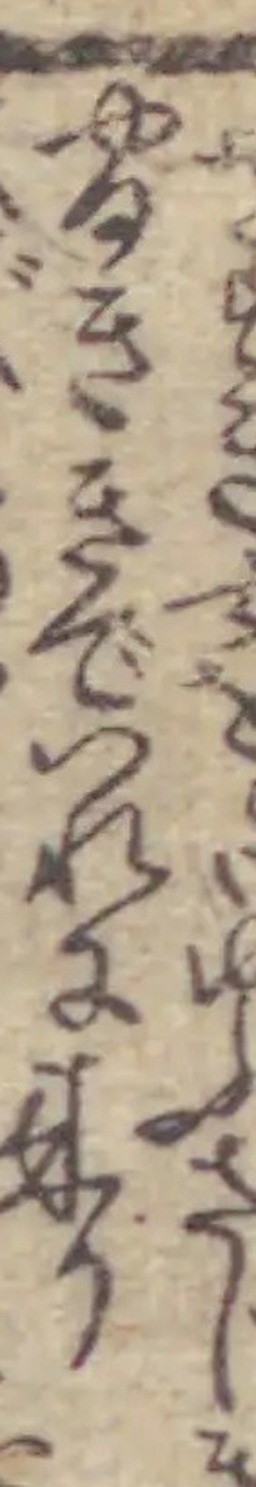やるききでつれに来り
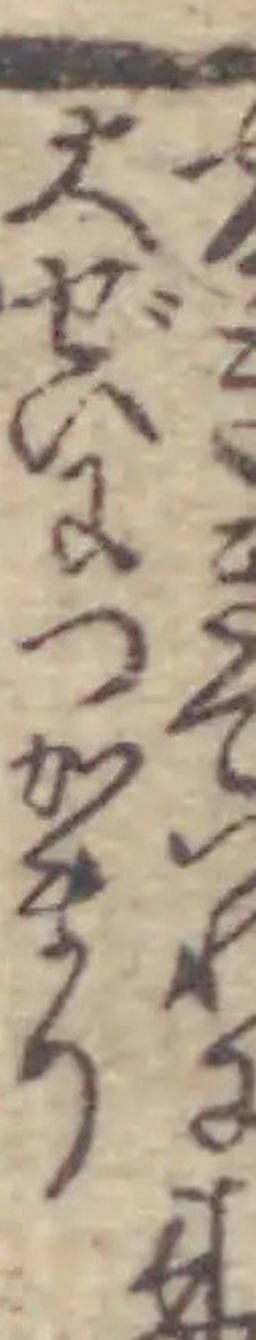大ぜいにつかまり
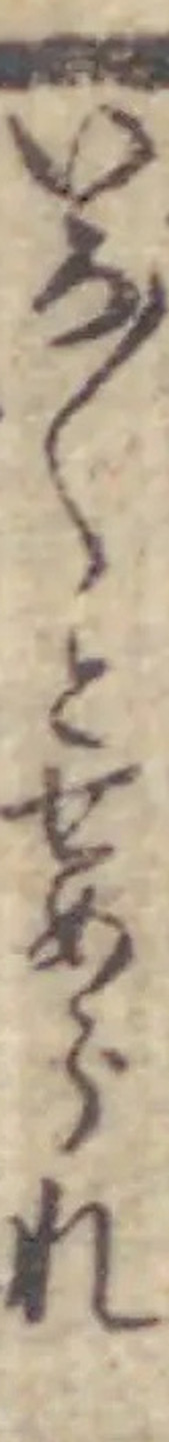いろ〳〵とせめられ
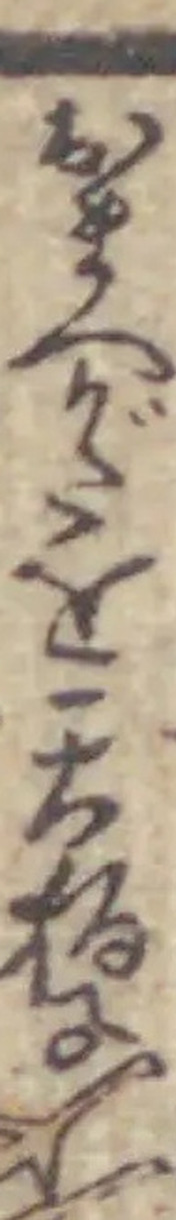おまへがたを天狗に
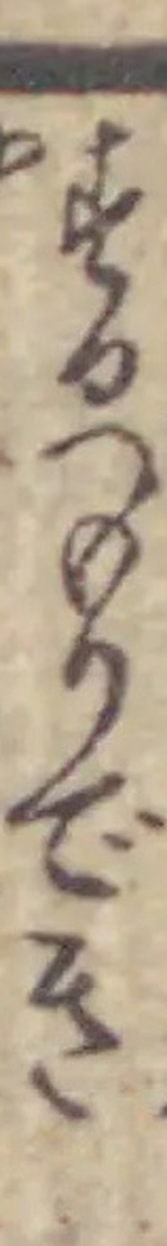するつもりでき
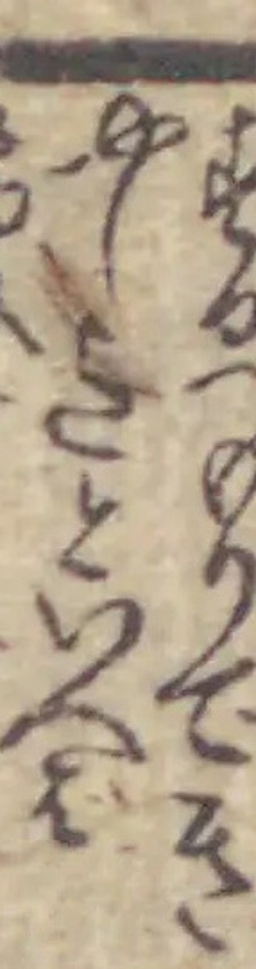やしたといへば
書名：珍説女天狗 2巻
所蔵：国立国会図書館 National Diet Library, JAPAN
